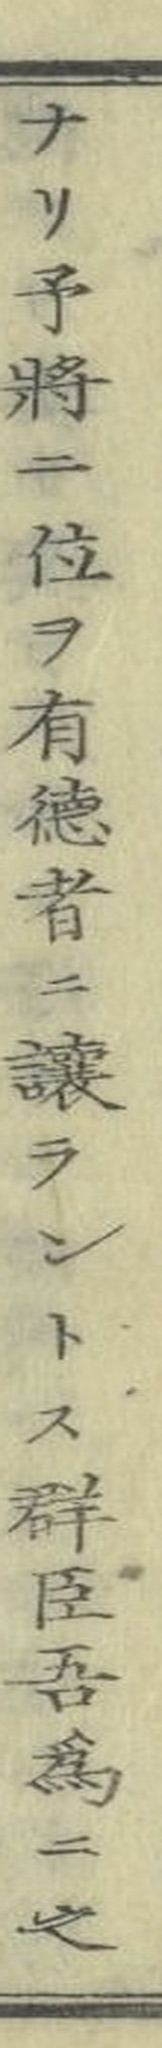ナリ予將ニ位ヲ有德者ニ讓ラントス群臣吾爲ニ之
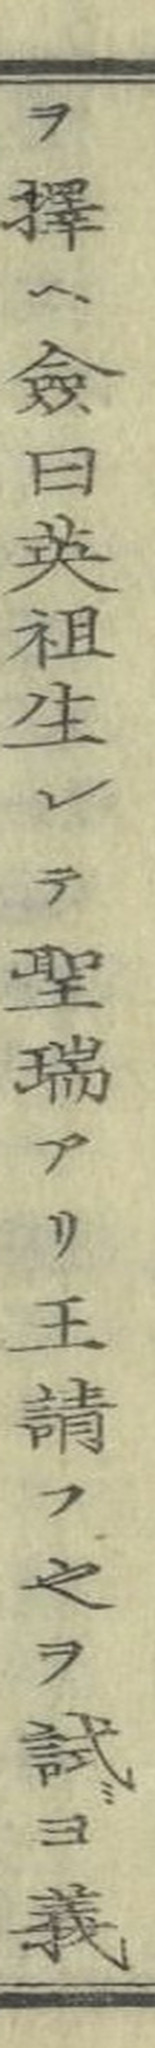ヲ擇ヘ僉曰英祖生レテ聖瑞アリ王請フ之ヲ試ヨ義
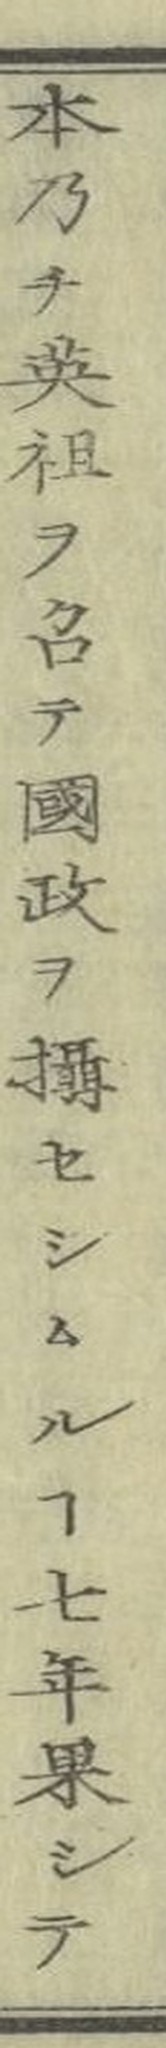本乃チ英租ヲ召テ國政ヲ攝セシムルコト七年果シテ
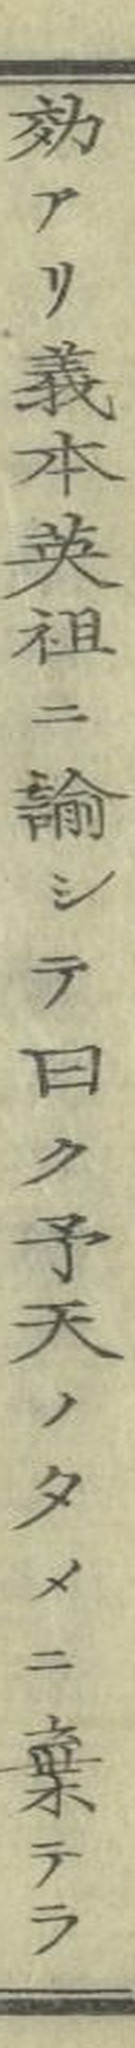効アリ義本英祖ニ諭シテ曰ク予天ノタメニ棄テラ
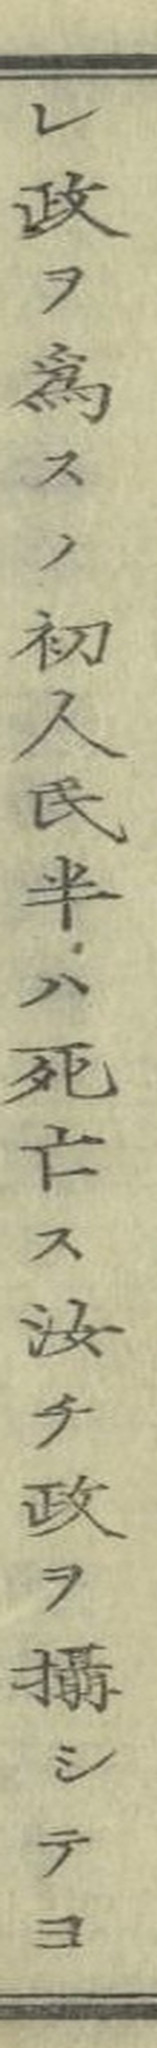レ政ヲ爲スノ初人民半ハ死亡ス汝チ政ヲ攝シテヨ
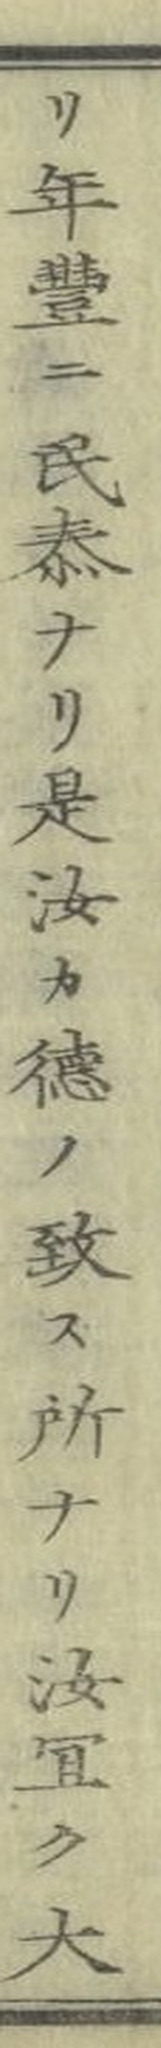リ年豐ニ民恭ナリ是汝カ德ニ致ス所ナリ汝冝ク大
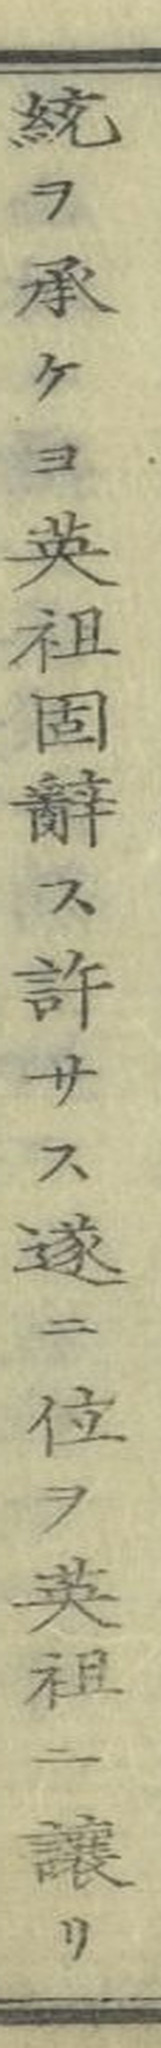統ヲ承ケヨ英祖固辭ス許サス遂ニ位ヲ英祖ニ讓リ

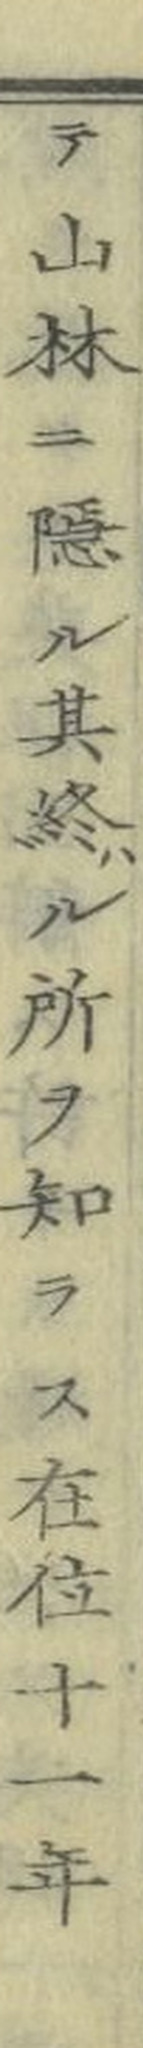テ山林ニ隱ル其終ル所ヲ知ラス在位十一年
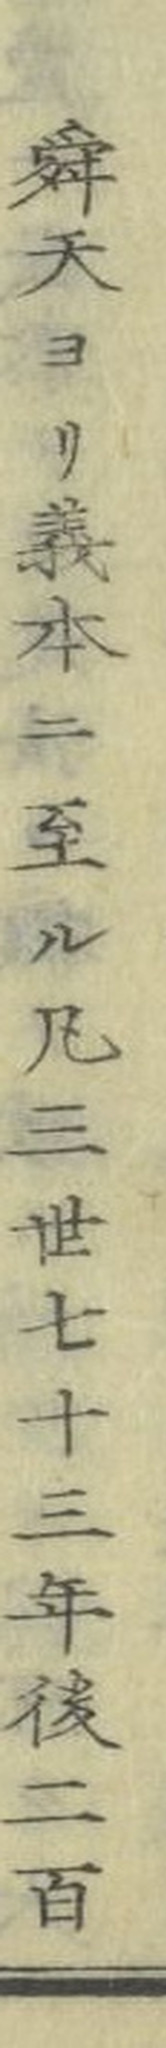舜天ヨリ義本ニ至ル凡三世七十三年後二百
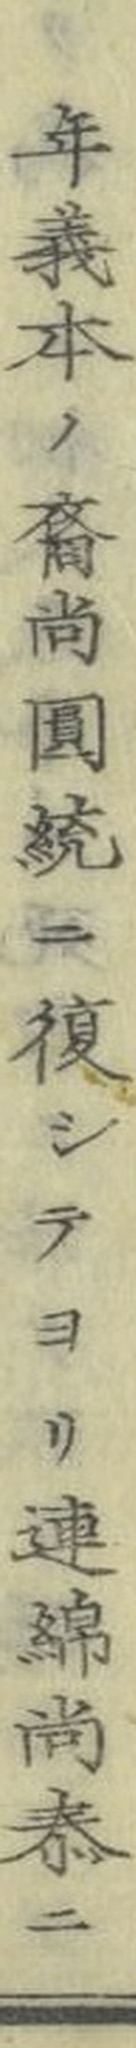年義本ノ裔尚圓統ニ復シテヨリ連錦尚泰ニ
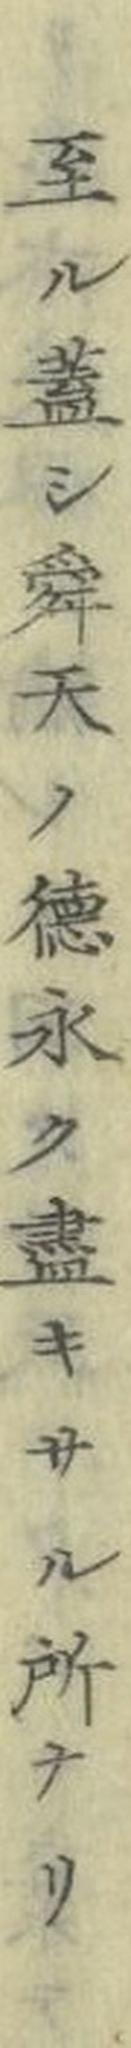至ル蓋シ舜天ノ德永ク盡キサル所ナリ
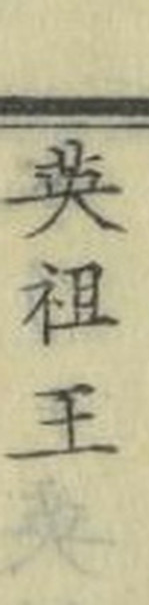英祖王
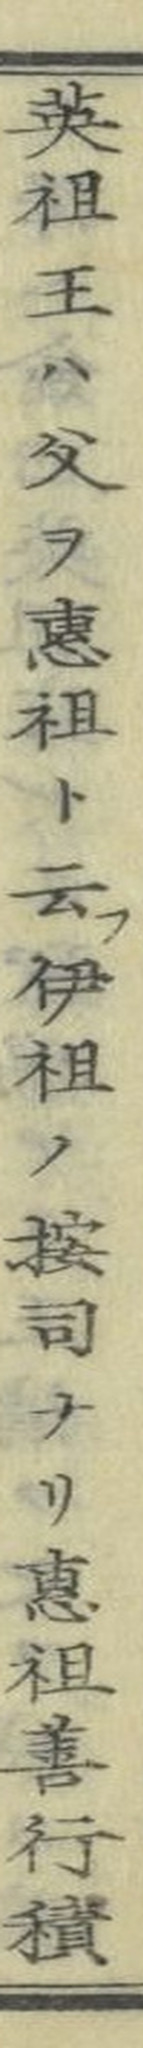英祖王ハ父ヲ惠租ト云伊祖ノ按司ナリ惠租善行積
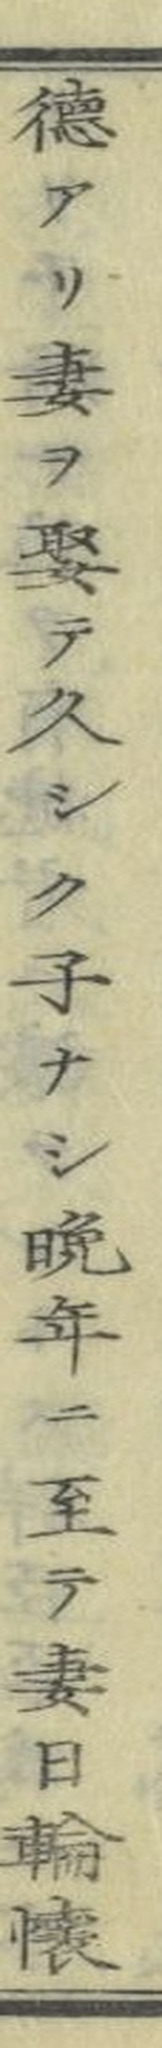德アリ妻ヲ娶テ久シク子ナシ晚年ニ至テ妻日輪懐
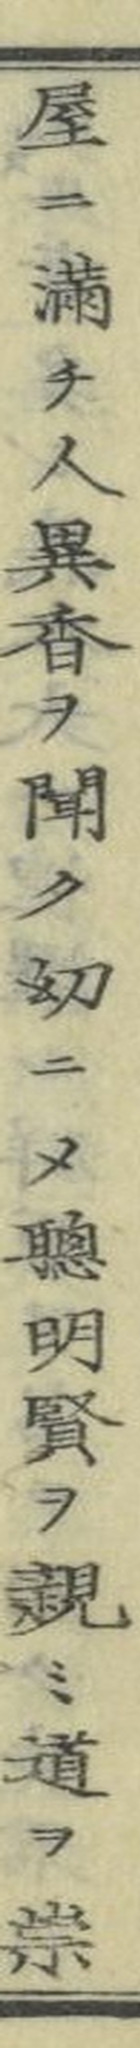屋ニ满チ人異香ヲ聞ク幼ニシテ聰明賢ヲ親ミ道ヲ崇
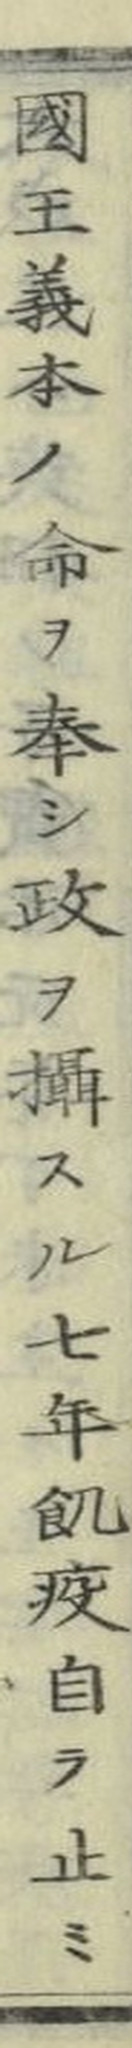國王義本ノ命ヲ奉シ政ヲ攝スル七年飢疫自ラ止ミ
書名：琉球藩史 一之巻
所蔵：University of the Ryukyus Library
